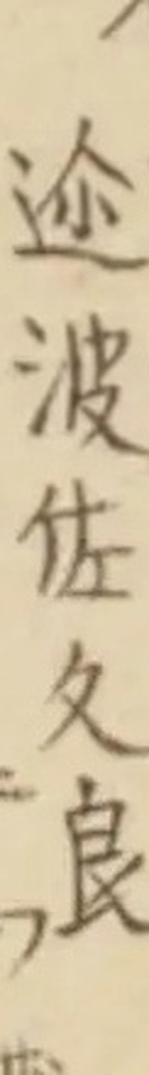迩波佐久良
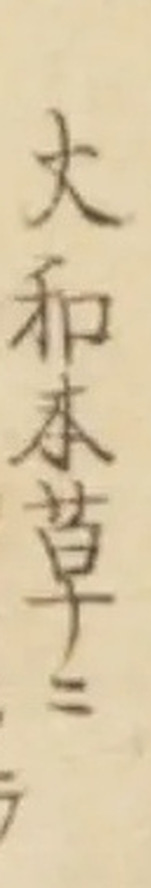大和本草ニ
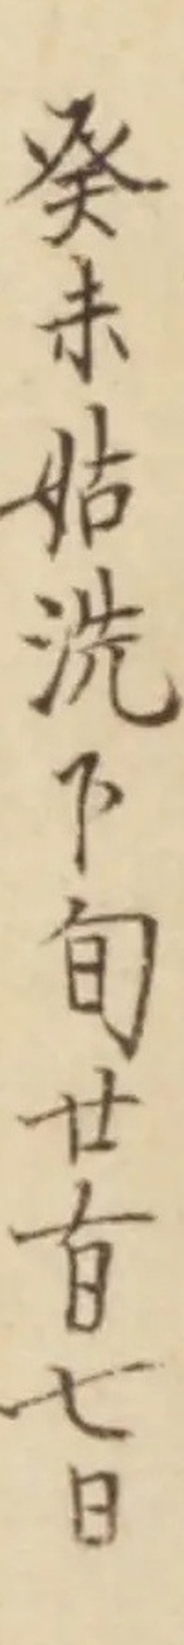癸未姑洗下旬廿有七日
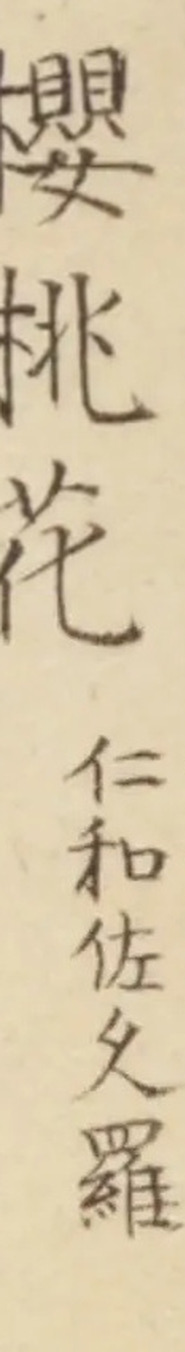桜桃花仁和佐久羅
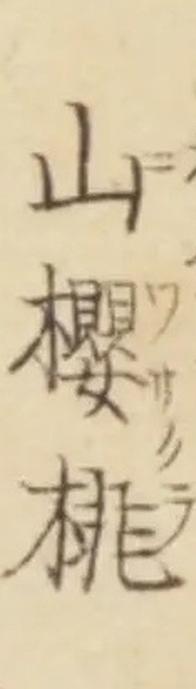山桜棑
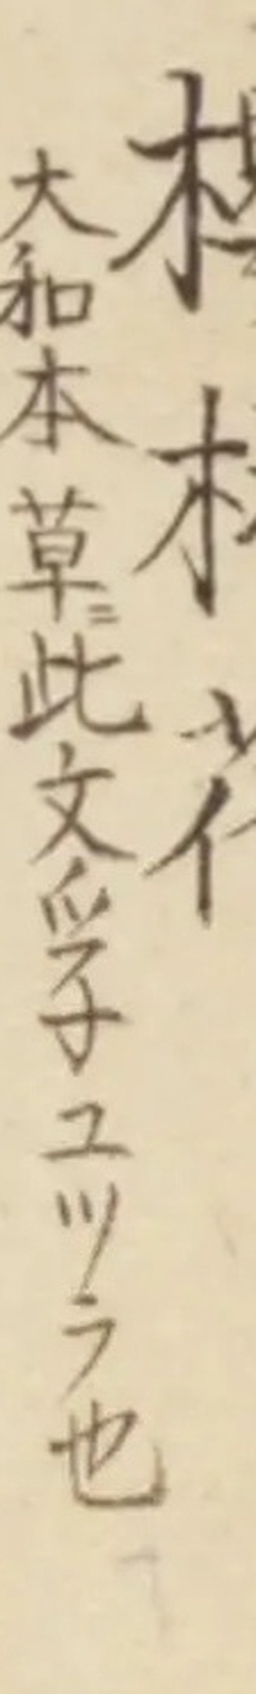大和本草此文字ユツラ也
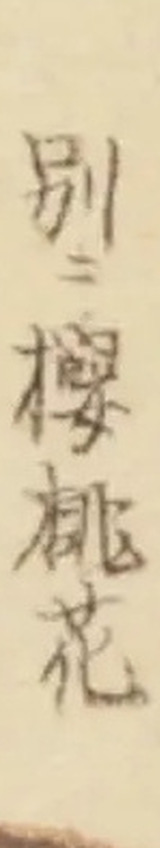別ニ桜棑花
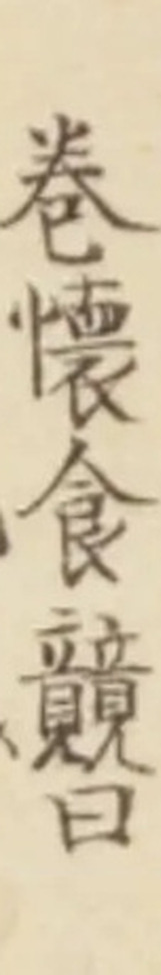巻懐食競曰
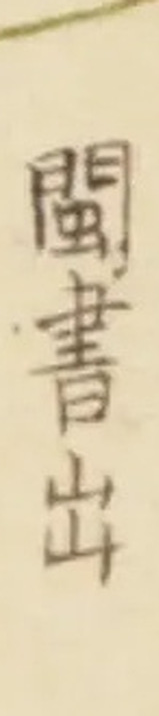閩書出
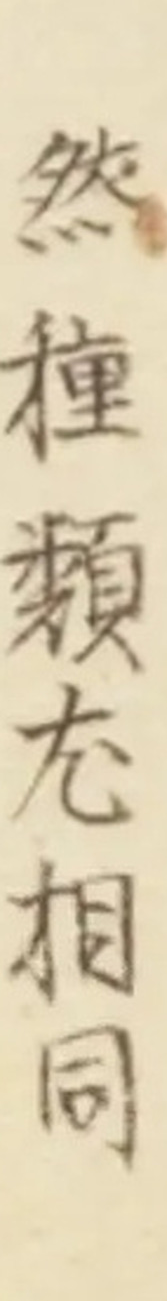然種類尤相同
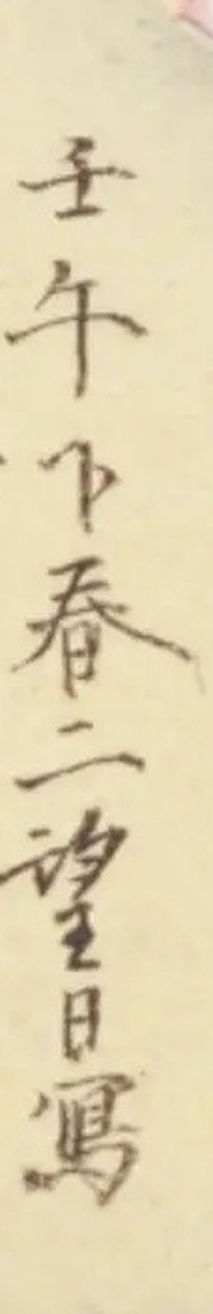壬午下春二望日写
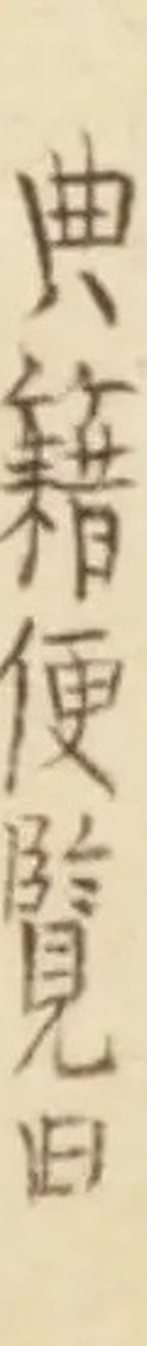典籍便覧曰
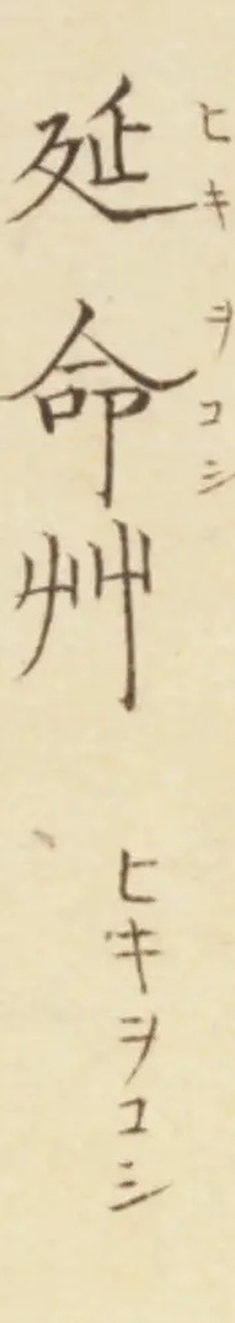延命艸ヒキヲコシ
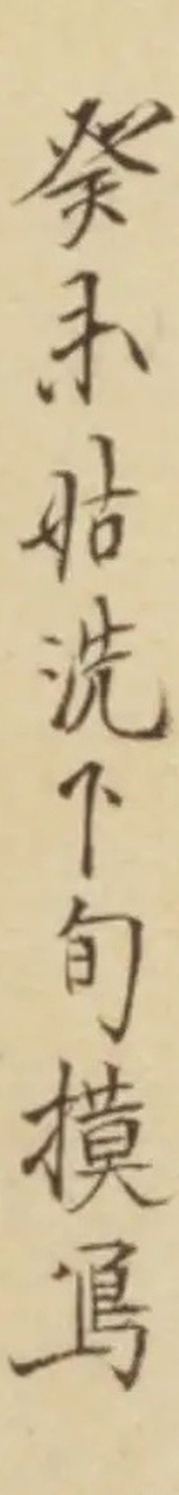癸未姑洗下旬模写

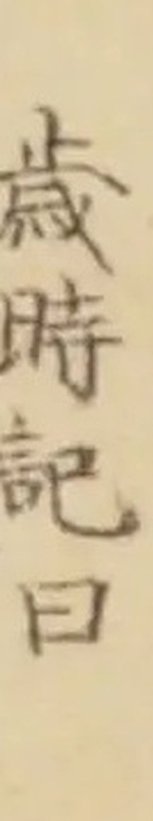歳時記曰
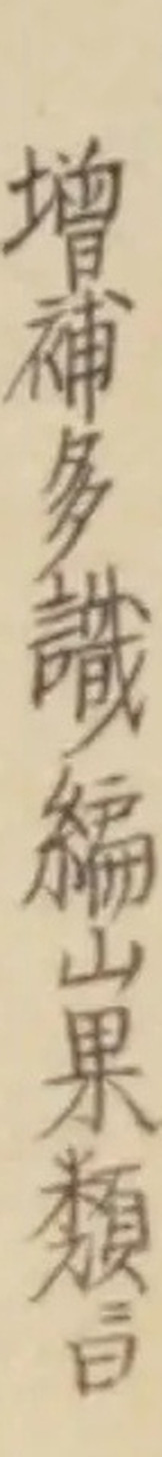増補多識編山果類曰
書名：梅園草木花譜春之部. 1
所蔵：国立国会図書館 National Diet Library, JAPAN
